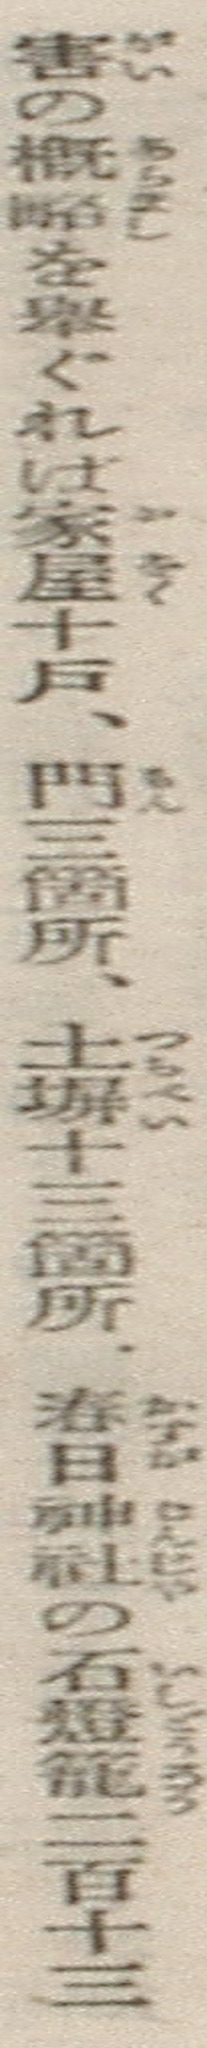害の概略を挙ぐれば家屋十戸、門三箇所、土塀十三箇所、春日神社の石燈籠二百十三
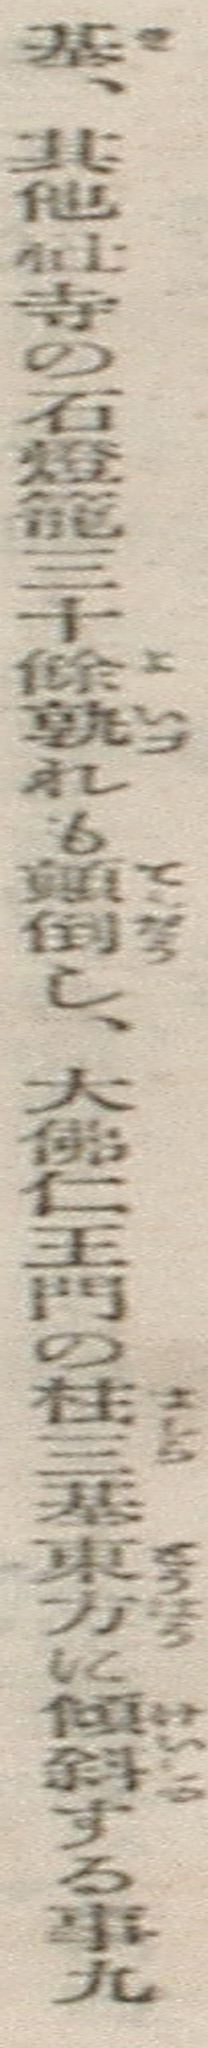基、其他社寺の石燈籠三十餘就れも顛倒し、大佛仁王門の柱三基東方に傾斜する事九
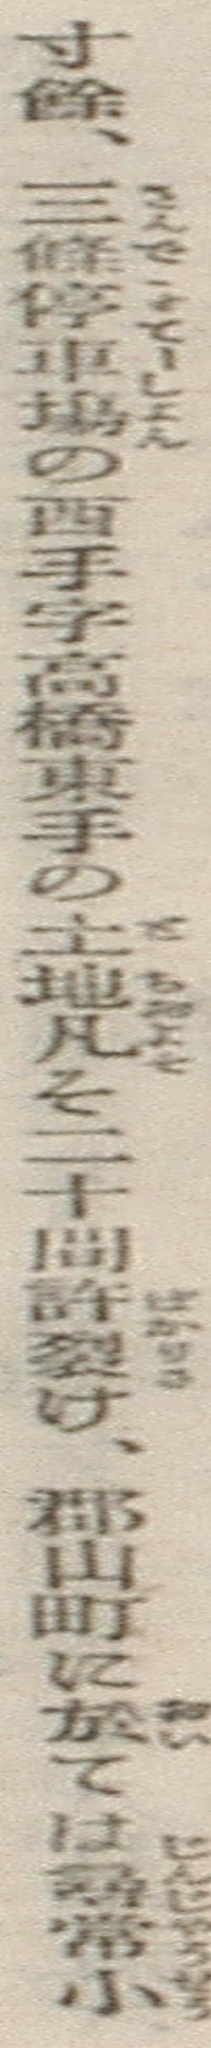寸餘、三條停車場の西手字高橋東手の土地凡そ二十間許裂け、郡山町に於ては尋常小
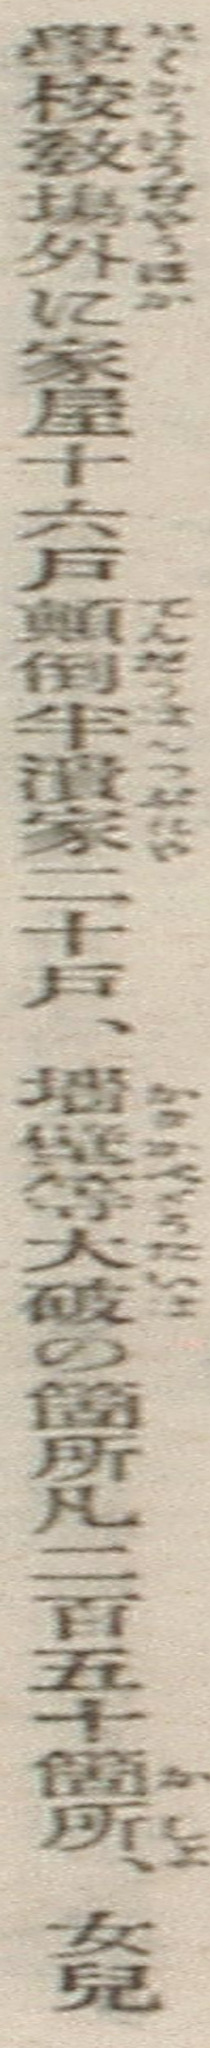學校教場外に家屋十六戸顛倒半潰家二十戸、墻壁等大破の箇所凡二百五十箇所、女児
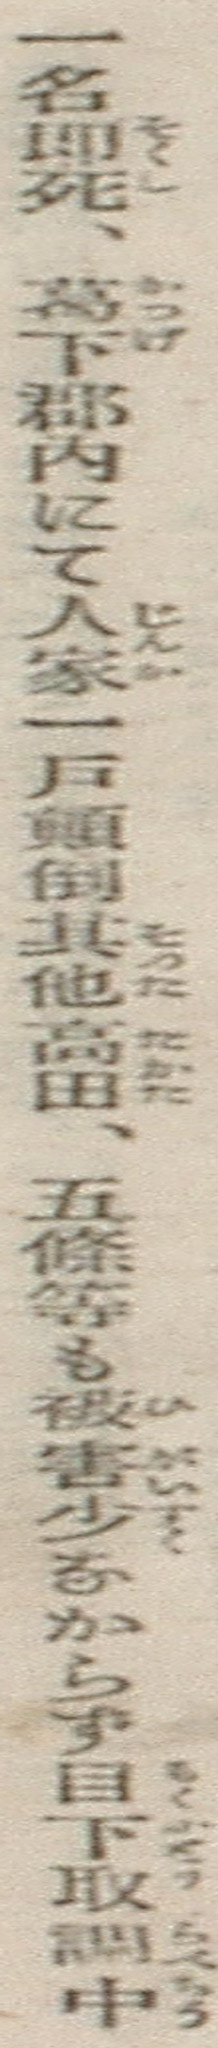一名即死、葛下郡内にて人家一戸顛倒其他高田、五條等も被害少なからず目下取調中
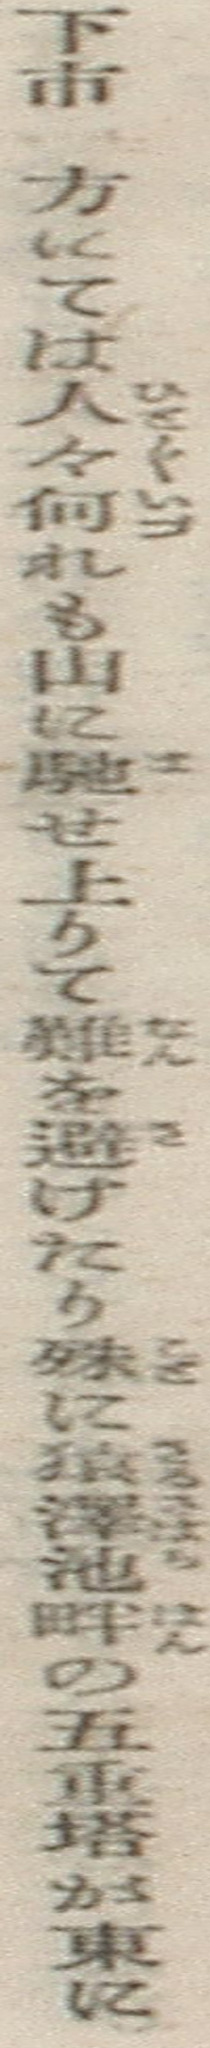下市方にては人々何れも山に馳せ上りて難を避けたり殊に猿澤池畔の五重塔が東に
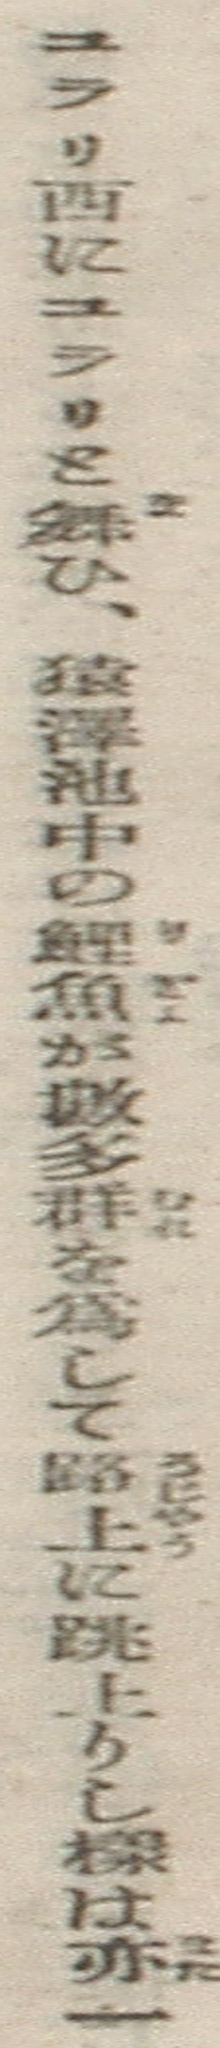ユラリ西にユラリと舞ひ、猿澤池中の鯉魚が数多群を為して路上に跳上りし様は亦一

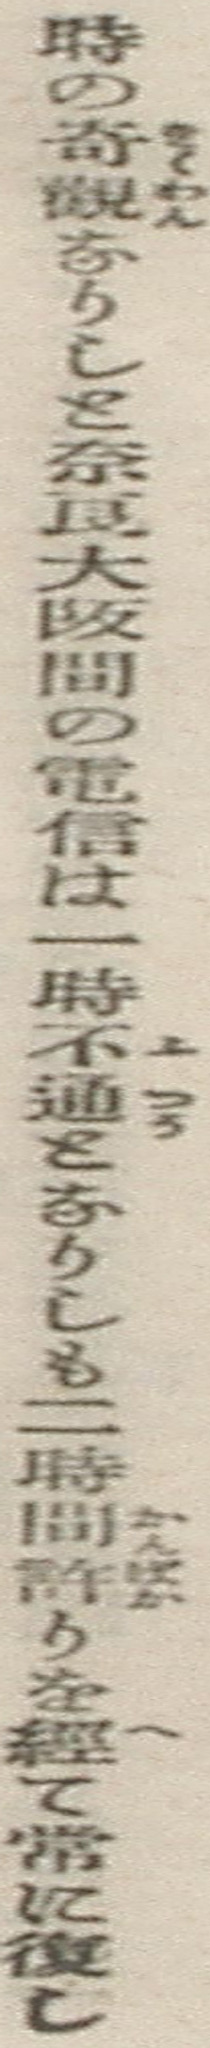時の奇観なりしと奈良大阪間の電信は一時不通となりしも二時間許り経て常に復し
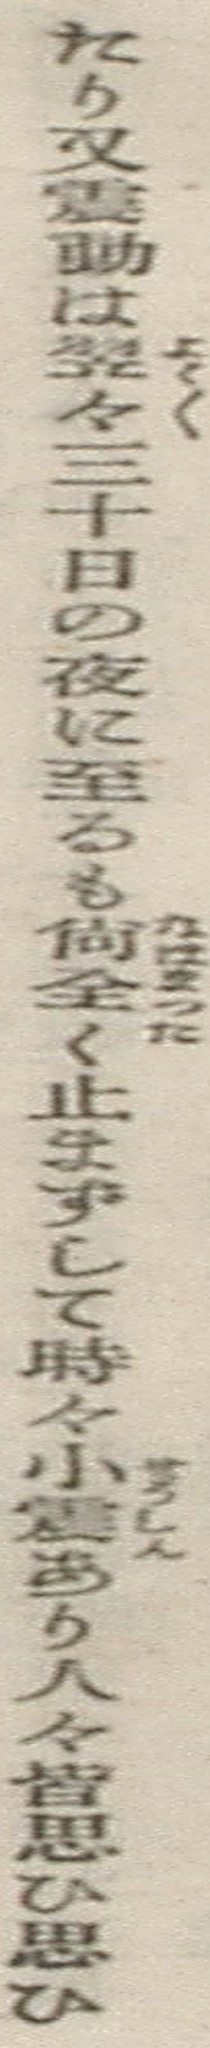たり又振動は翌々日三十日の夜に至るも尚全く止まずして時々小震あり人々皆思ひ思ひ
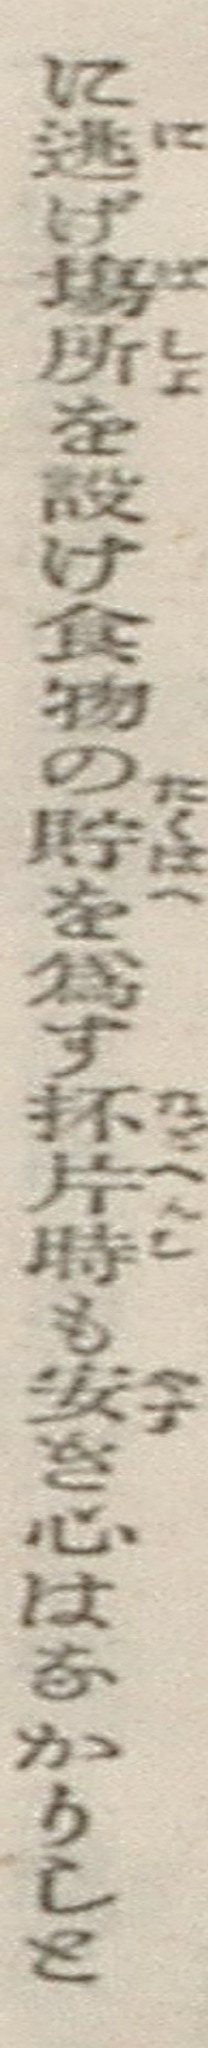に逃げ場所を設け食物の貯を為す抔片時も安き心はなかりしと
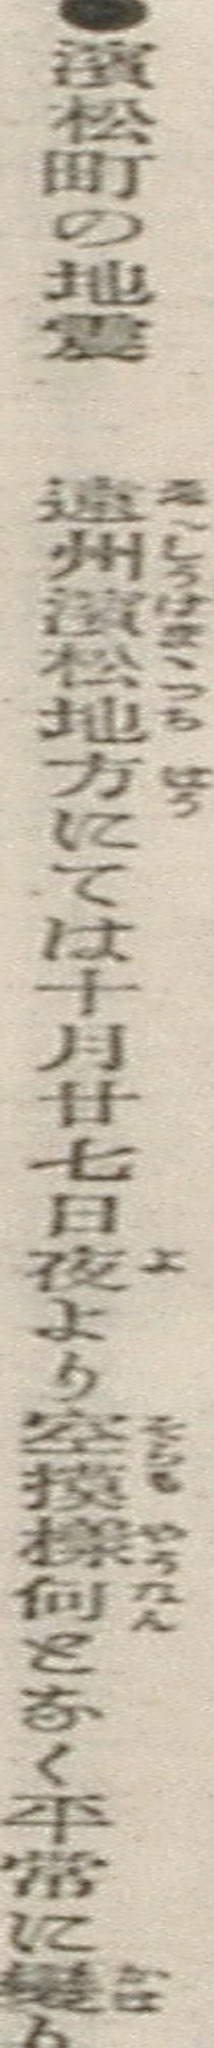●濱松町の地震遠州濱松地方にては十月廿七日夜より空模様何となく平常に変り
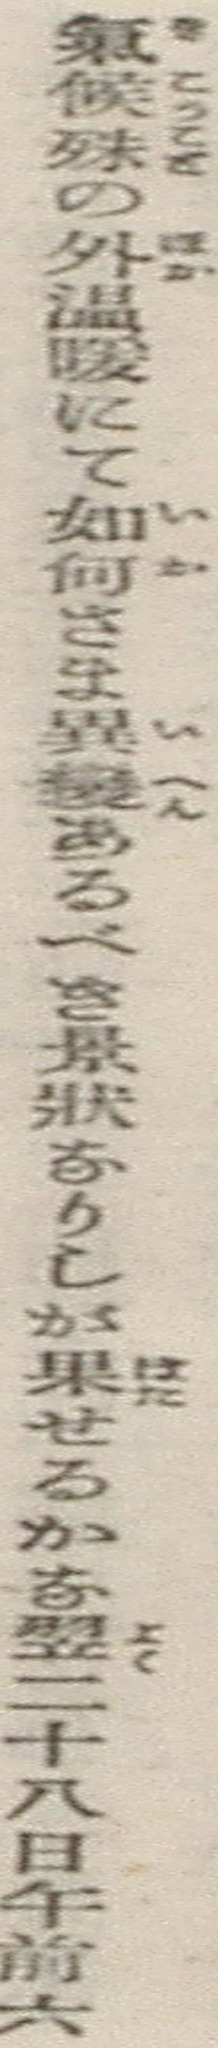気候殊の外温暖にて如何さま異変あるべき景状なりしが果たせるかな翌廿八日午前六
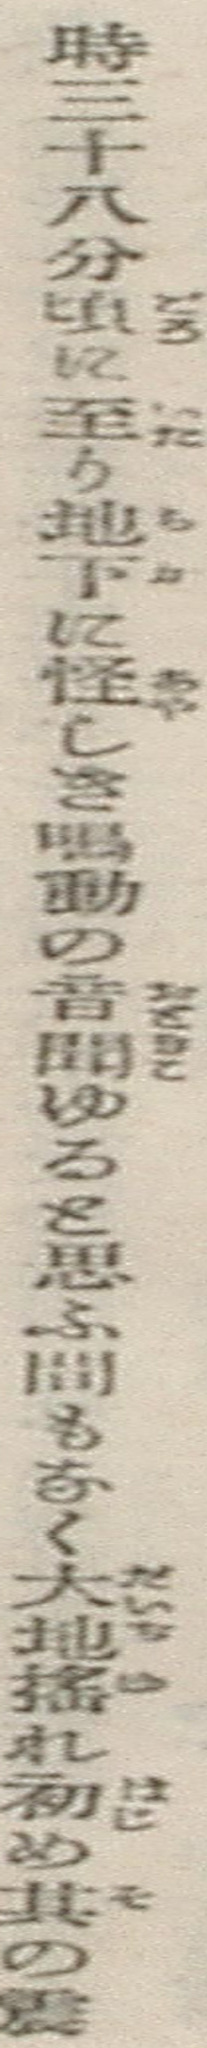時三十八分頃に至り地下に怪しき鳴動の音聞ゆると思ふ間もなく大地揺れ初め其の震
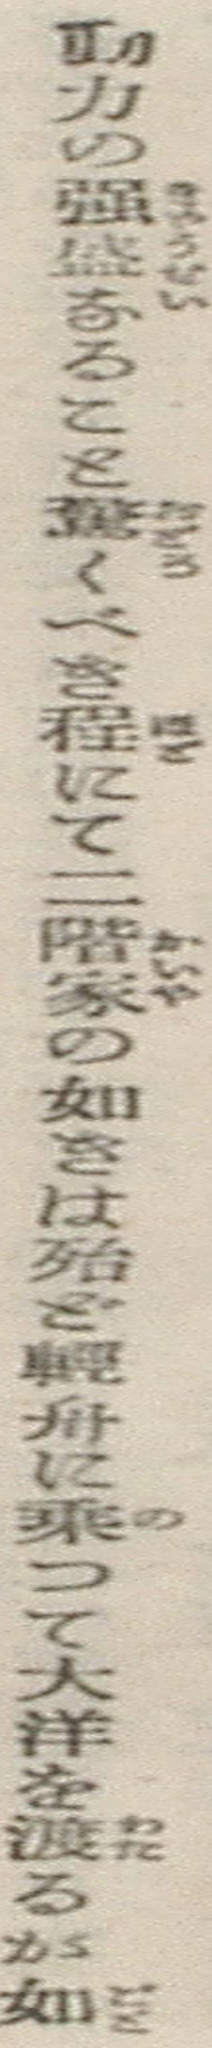動力の強盛なること驚くべき程にて二階家の如きは殆ど輕舟に乗つて大洋を渡るが如
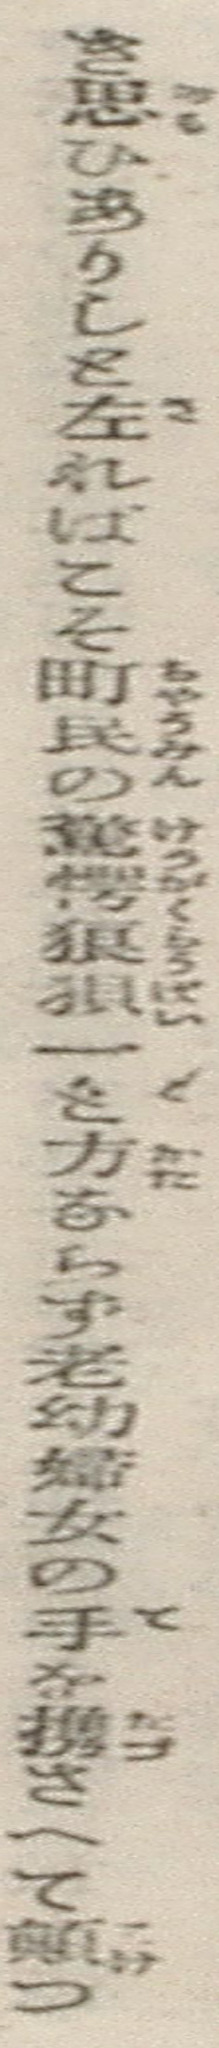き思ひありしと左ればこそ町民の驚愕狼狽一と方ならず老幼婦女の手を携さへて顛つ
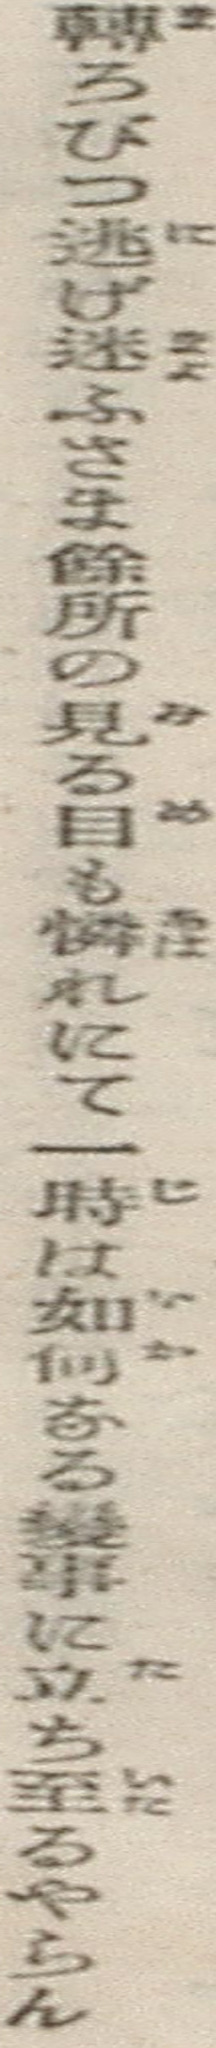転ろびつ逃げ迷うさま餘所の見る目も憐れにて一時は如何なる変時に立ち至るやらん
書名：愛知岐阜福井三県　大地震見聞録（内題）
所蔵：東京大学地震研究所図書室 Earthquake Research Institute Library, The University of Tokyo, JAPAN
